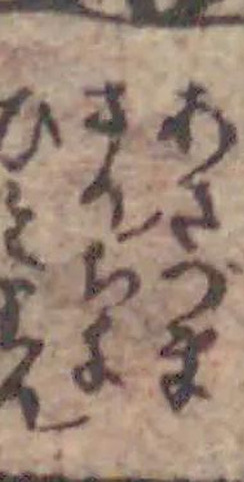ひとりん
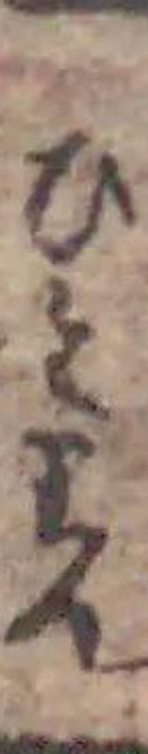ひとりん
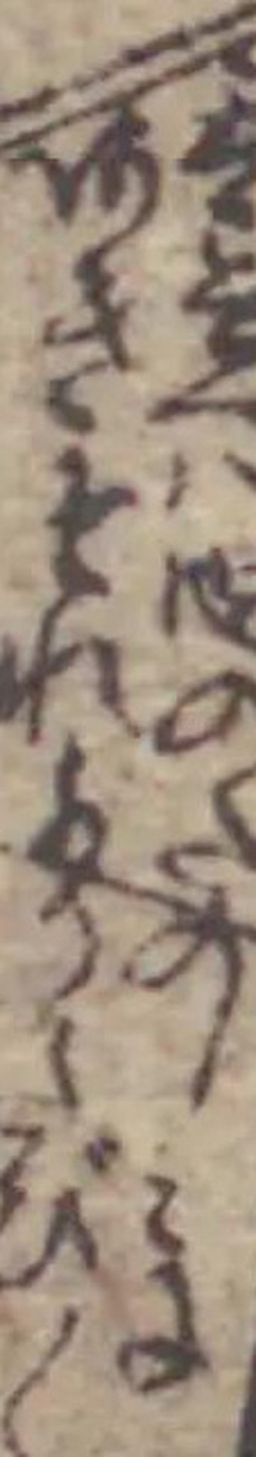あきそれよりたび〳〵
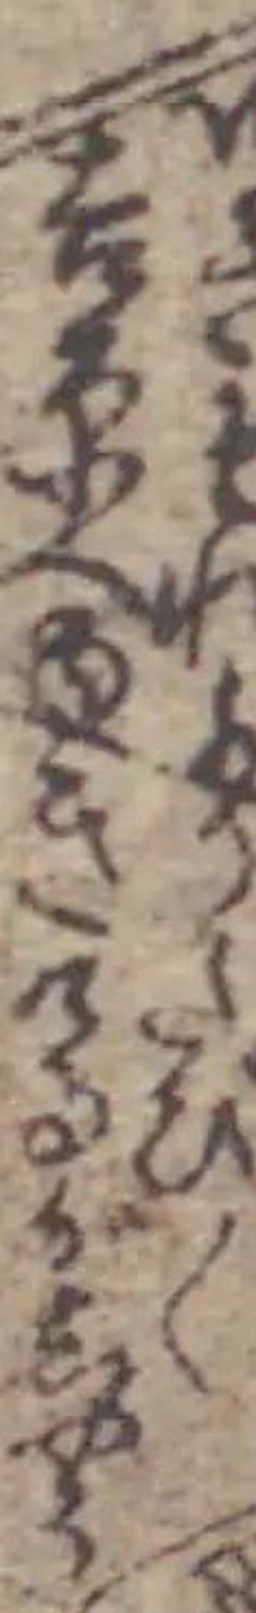吉原へゆきけるがしやう
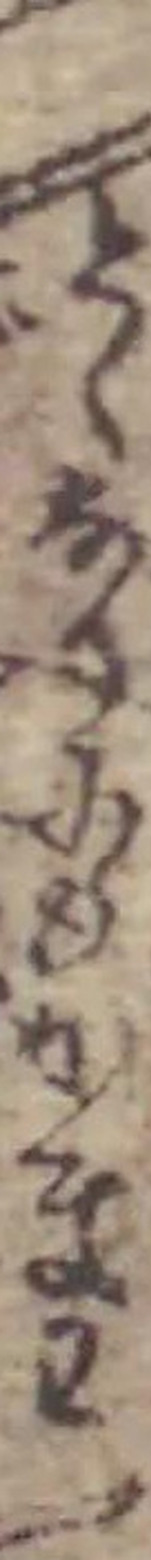とくなりにもかまわ
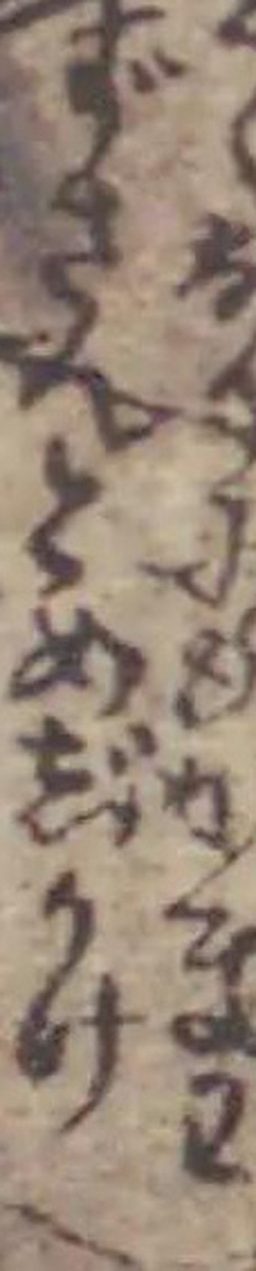ずさんとめじかけ
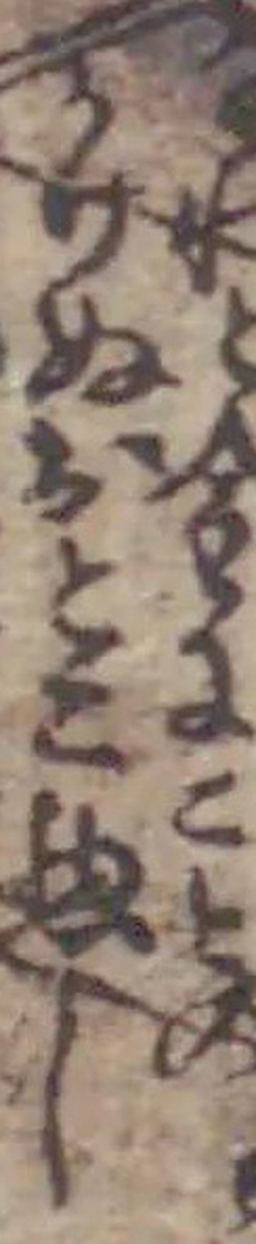かけぬおとこゆへし
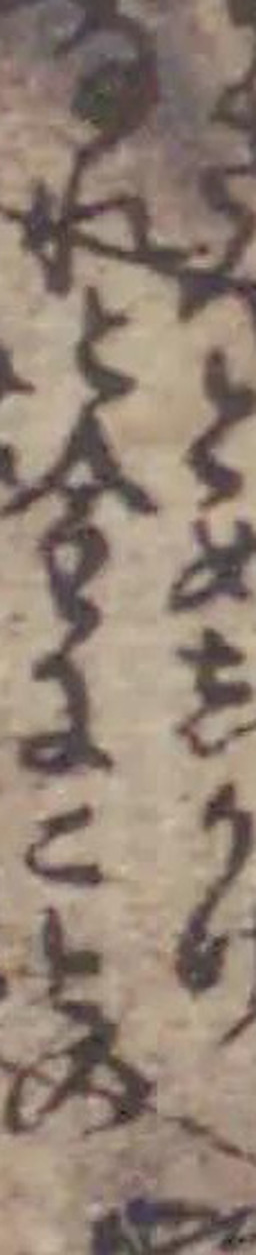なれと金にことの
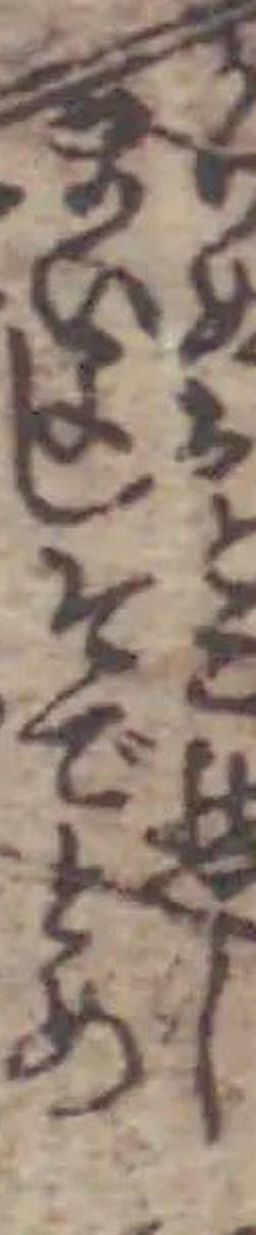まいよしそでとめ
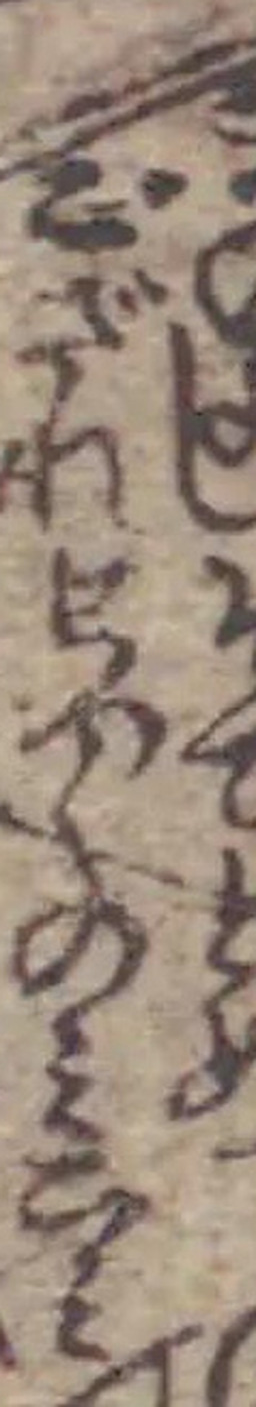ござれせつくのみこみ
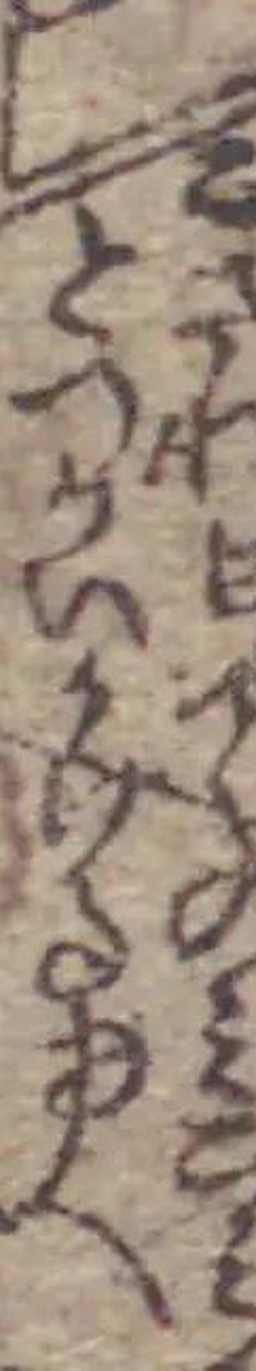とつかいかえるゆへ
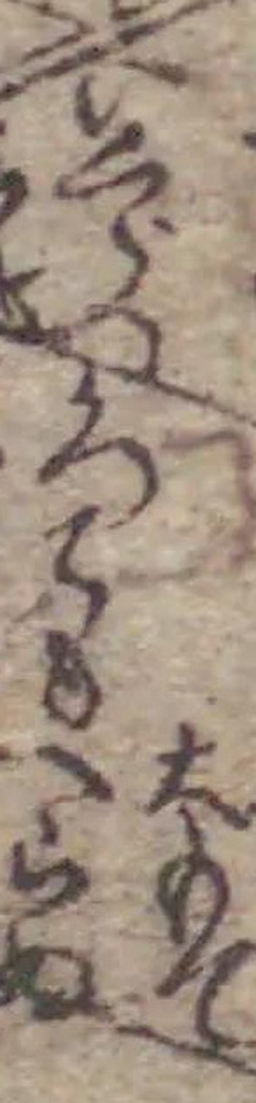いくらつかつてもへらぬ
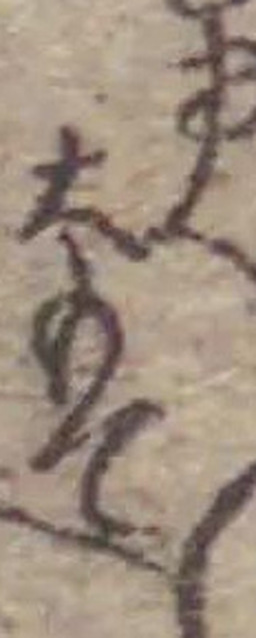大もて
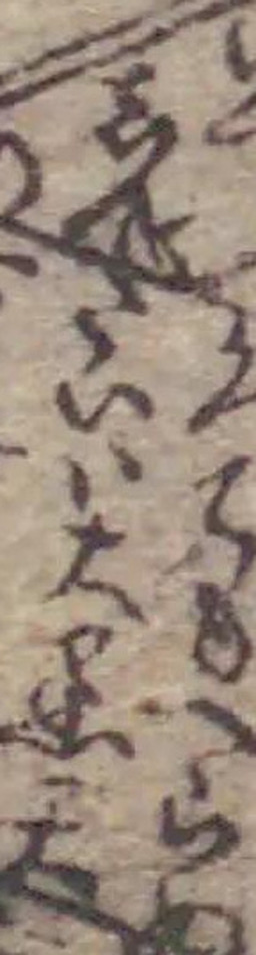しんだいは大黒天
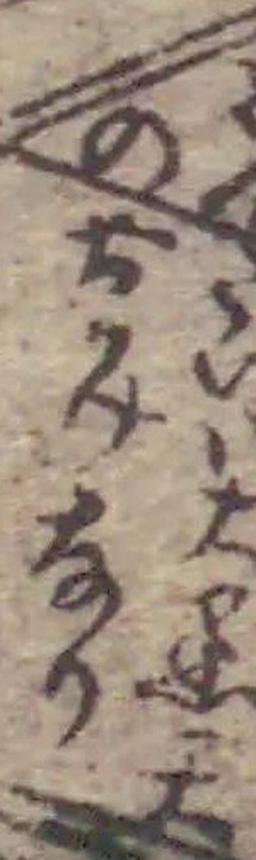のおかけなり

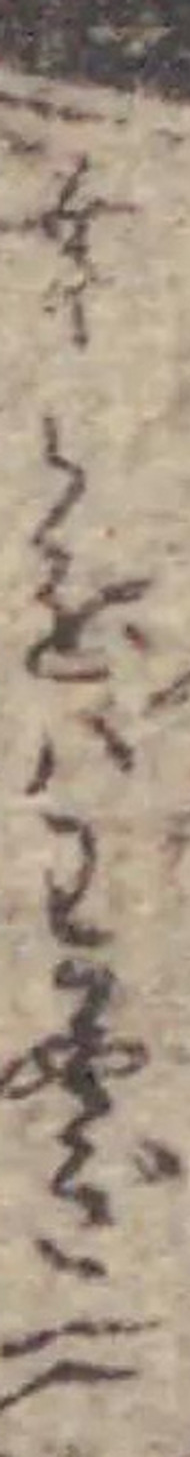幸之進はわかやぎ
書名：日待御利生此ごろ噂 3巻
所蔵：国立国会図書館 National Diet Library, JAPAN
